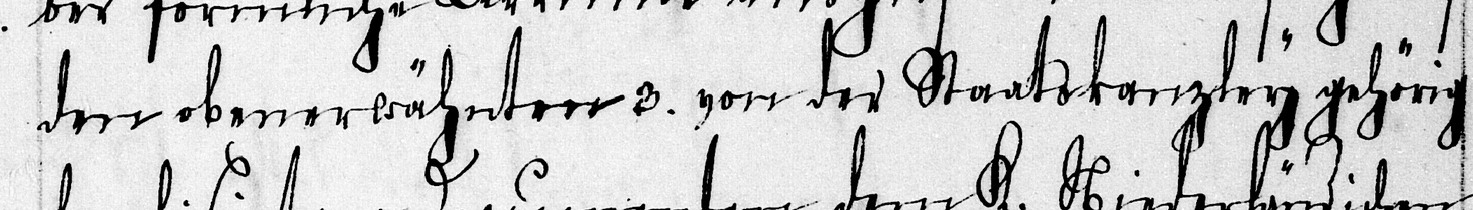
den obenerwähnten 3. von der Staatskanzley gehörig
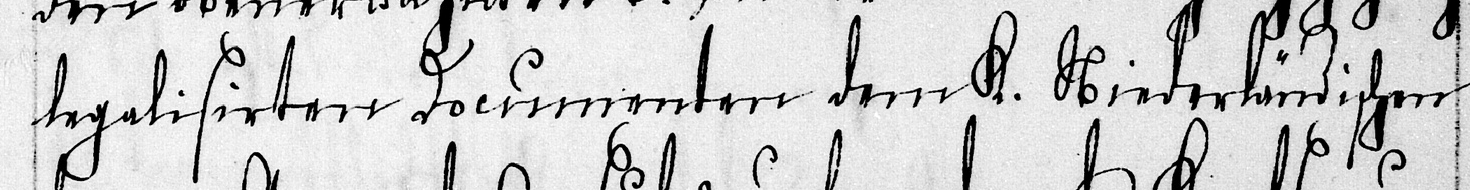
legalisirten Documenten dem K. Niederländischen
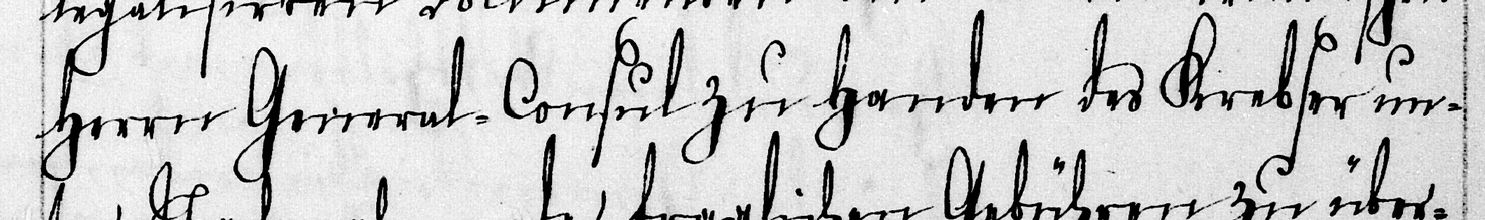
Herrn General-Consul zu Handen des Krebser un¬
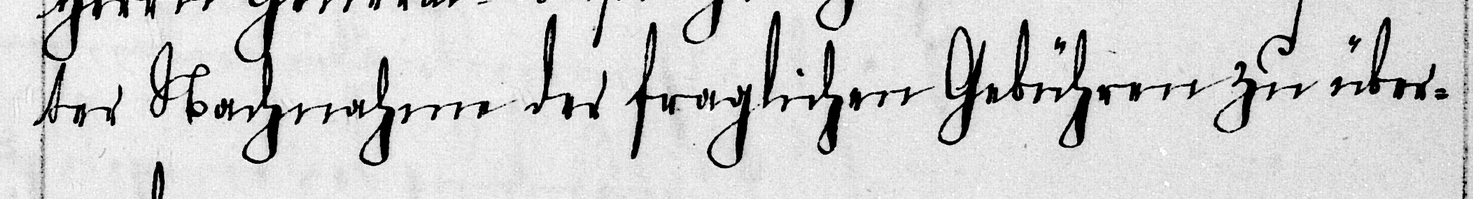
ter Nachnahme der fraglichen Gebühren zu über¬
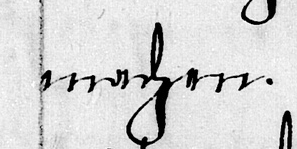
machen.
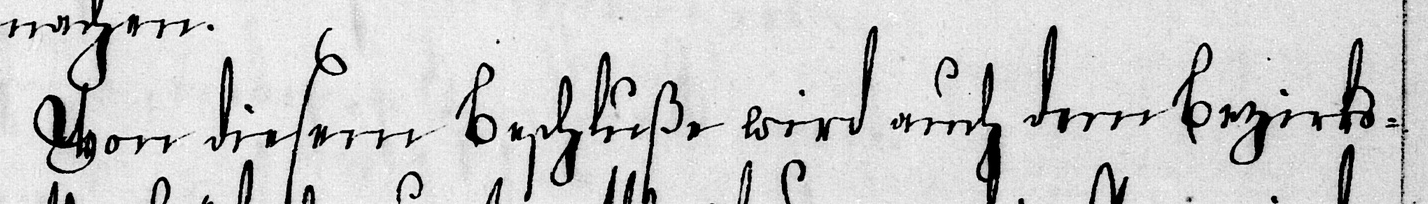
Von diesem Beschluße wird auch dem Bezirks¬
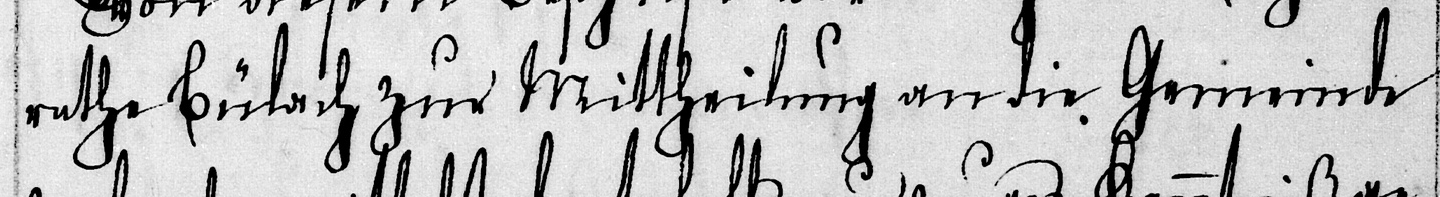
rathe Bülach zur Mittheilung an die Gemeinde
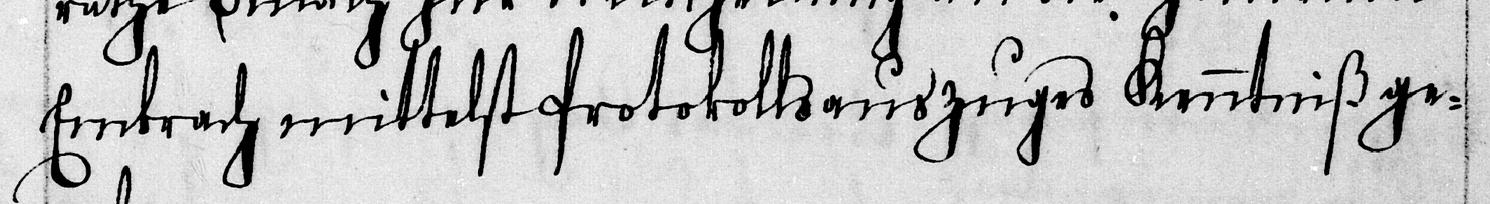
Embrach mittelst Protokollsauszuges Kenntniß ge¬
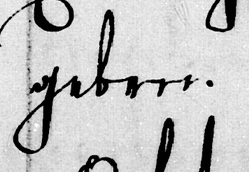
geben.
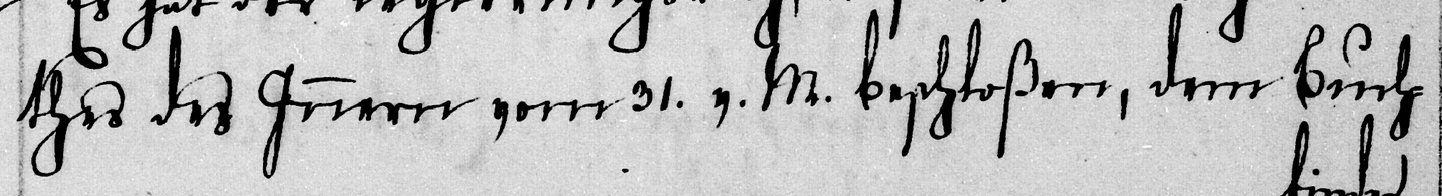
thes des Innern vom 31. v. M. beschloßen, dem Buch-
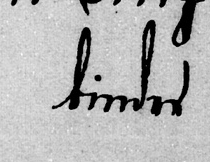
nebst
